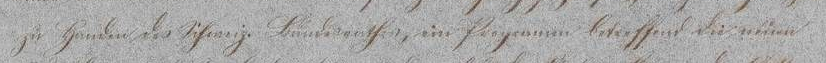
zu Handen des Schweiz. Bundesrathes, ein Programm betreffend die neuen
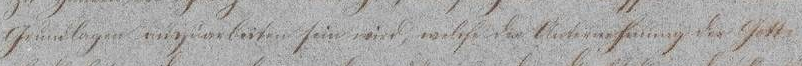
Grundlagen auszuarbeiten sein wird, welche der Unternehmung der Gott-
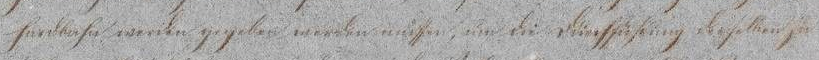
hardbahn werden gegeben werden müssen, um die Durchführung derselben zu
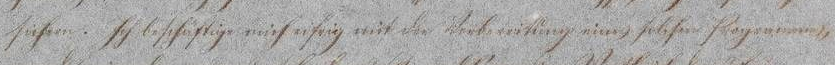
sichern. Ich beschäftige mich eifrig mit der Vorbereitung eines solchen Programmes,
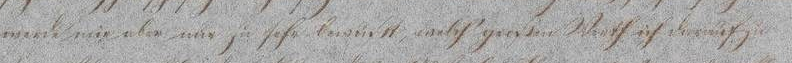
werde mir aber nur zu sehr bewußt, welchen großen Werth ich darauf zu
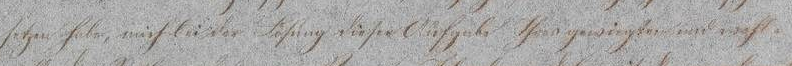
setzen habe, mich bei der Lösung dieser Aufgabe Ihres gewiegten und wohl-
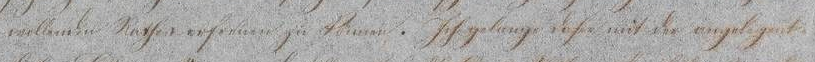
wollenden Rathes erfreuen zu können. Ich gelange daher mit der angelegent-
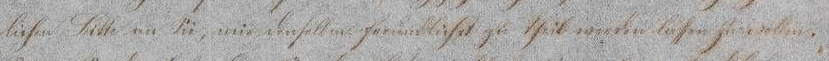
lichen Bitte an Sie, mir denselben freundlichst zu Theil werden lassen zu wollen.
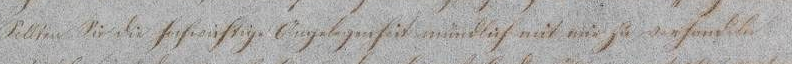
Sollten Sie die hochwichtige Angelegenheit mündlich mit mir zu verhandeln
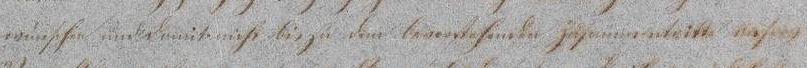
wünschen und damit nicht bis zu dem bevorstehenden Zusammentritte unsers
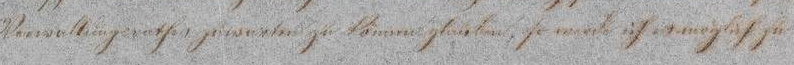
Verwaltungsrathes zuwarten zu können glauben, so werde ich es möglich zu
